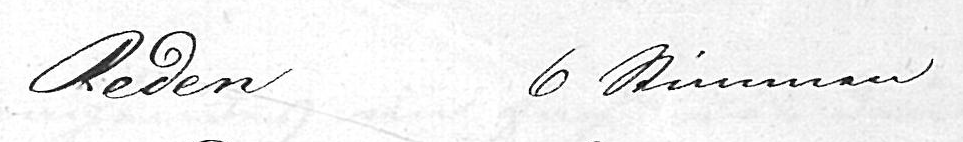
Reden 6 Stimmen
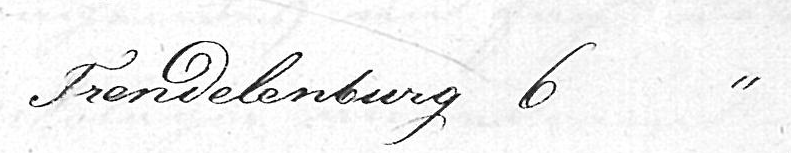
Trendelenburg 6 "
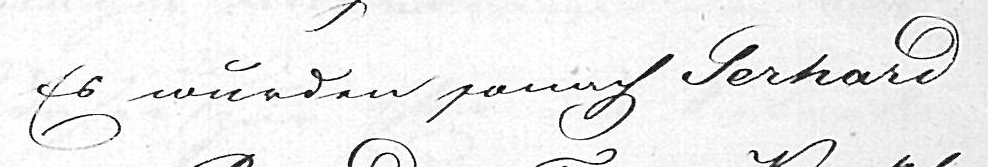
Es wurden sonach Gerhard
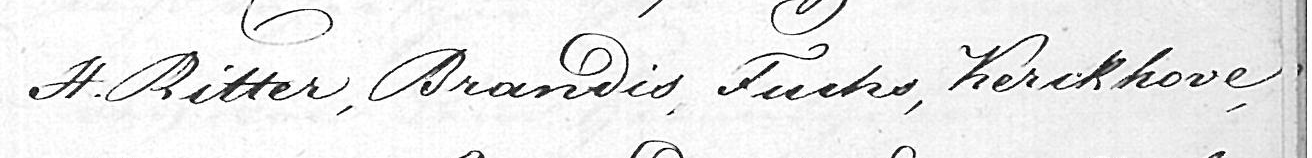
H. Ritter, Brandis, Fuchs, Kerckhove,
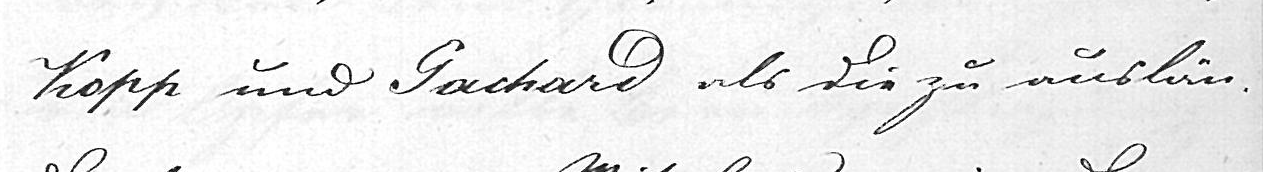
Kopp und Gachard als die zu auslän-
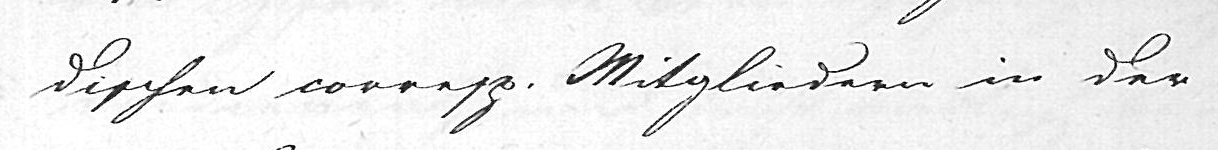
dischen corresp. Mitgliedern in der
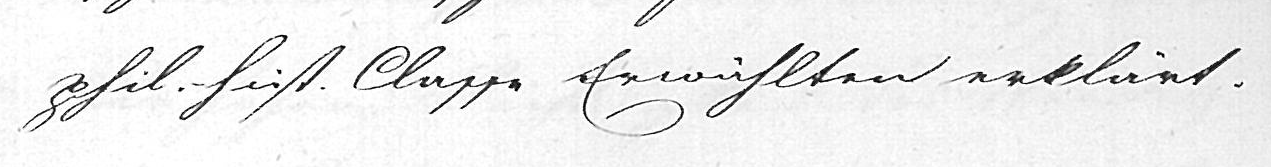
phil.-hist. Classe Erwählten erklärt.
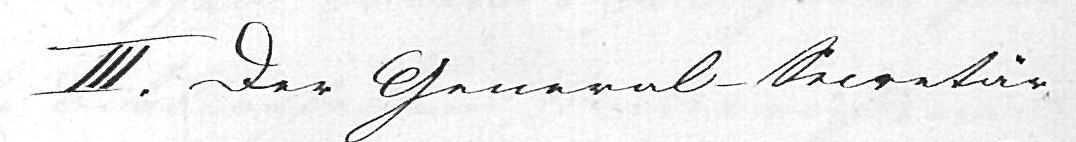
III. Der General-Secretär
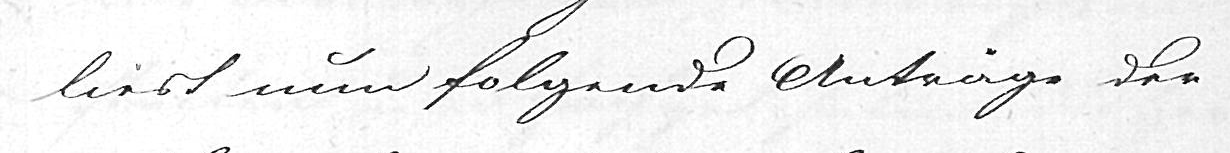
liest nun folgende Anträge der
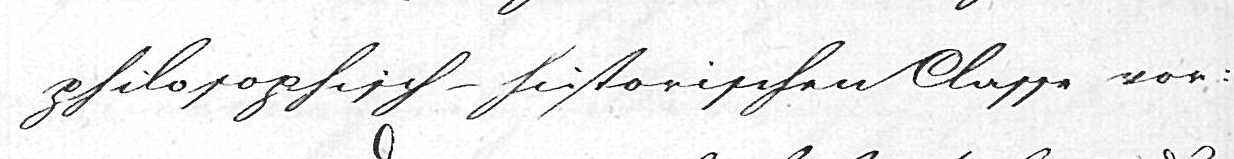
philosophsch-historischen Classe vor:
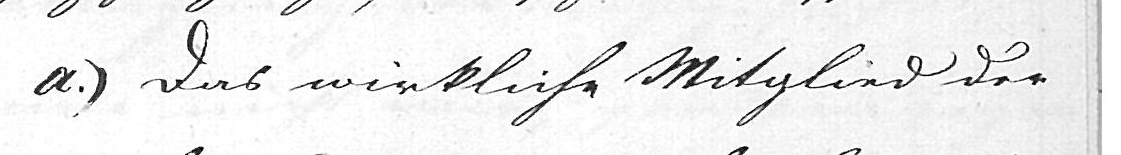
a.) Das wirkliche Mitglied der
